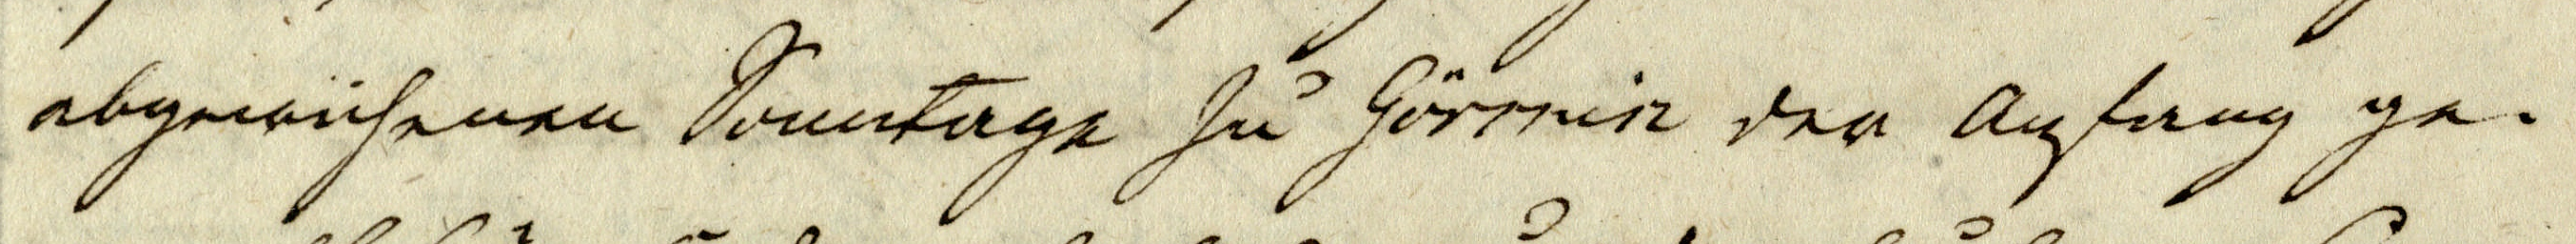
abgewichenen Sonntage zu Görmin der Anfang ge¬
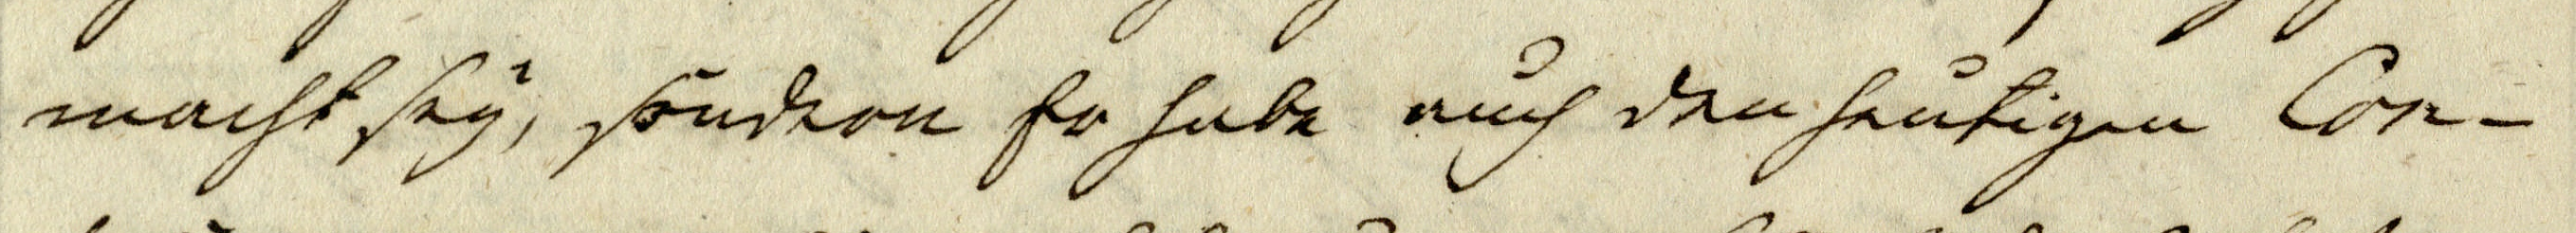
macht seÿ, sondern Er habe auch den heutigen Con¬
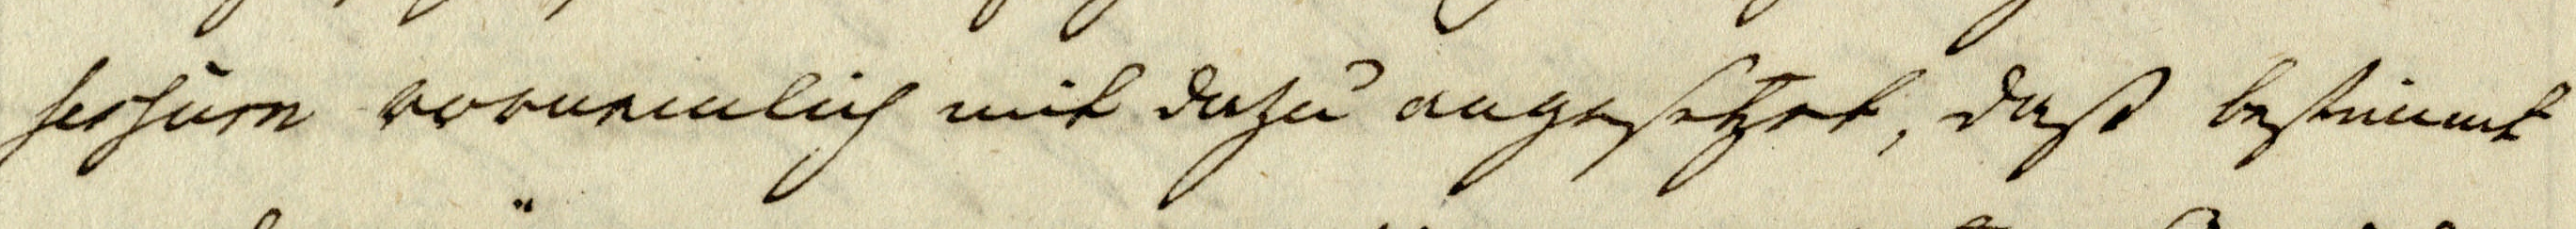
sessum vornemlich mit dazu angesetzet, daß bestimmt
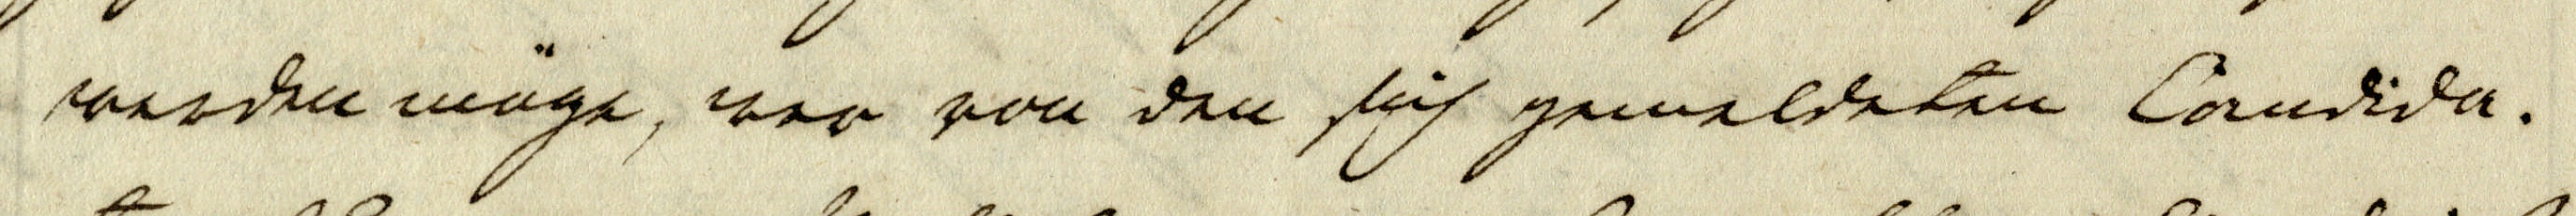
werden möge, wer von den sich gemeldeten Candida¬
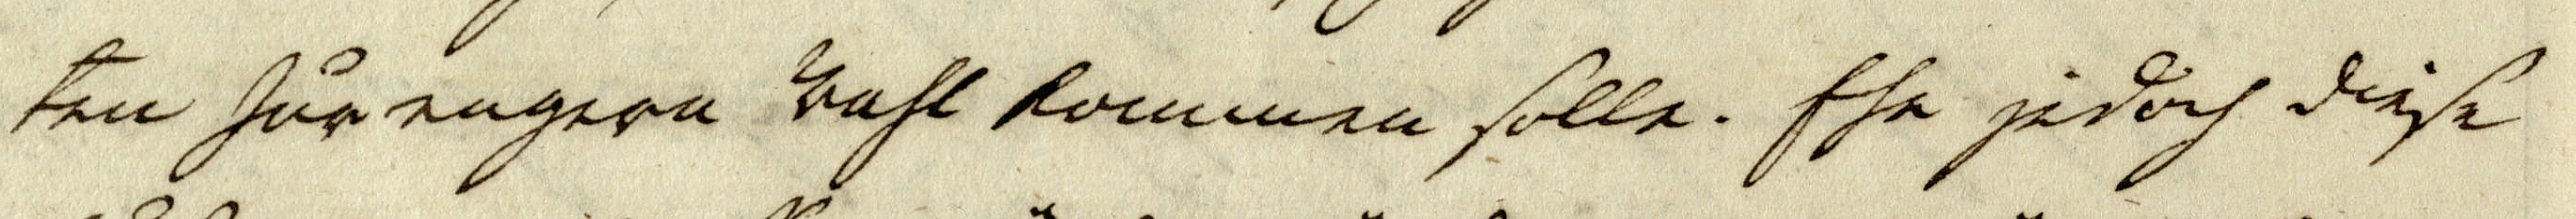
ten zur engern Wahl kommen solle. Ehe jedoch diese
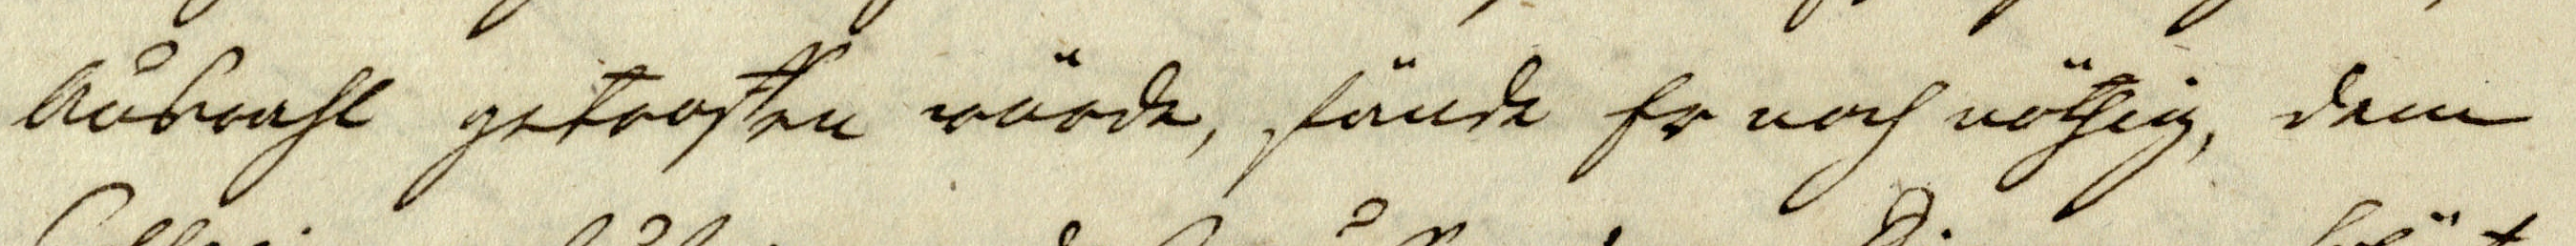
Auswahl getroffen würde, fände Er noch nöthig, dem
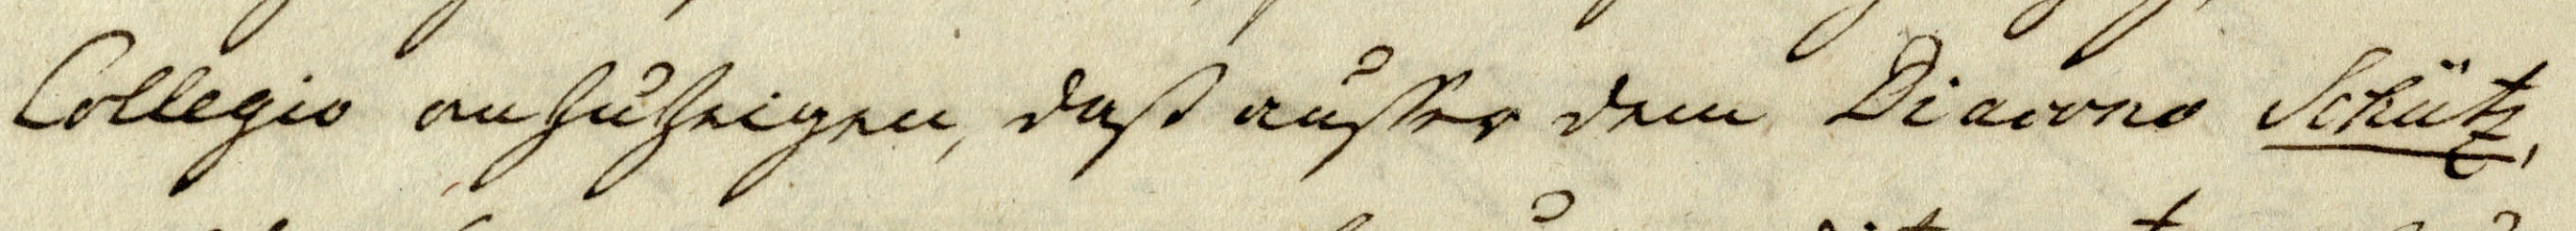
Collegio anzuzeigen, daß ausser dem Diacono Schütz,
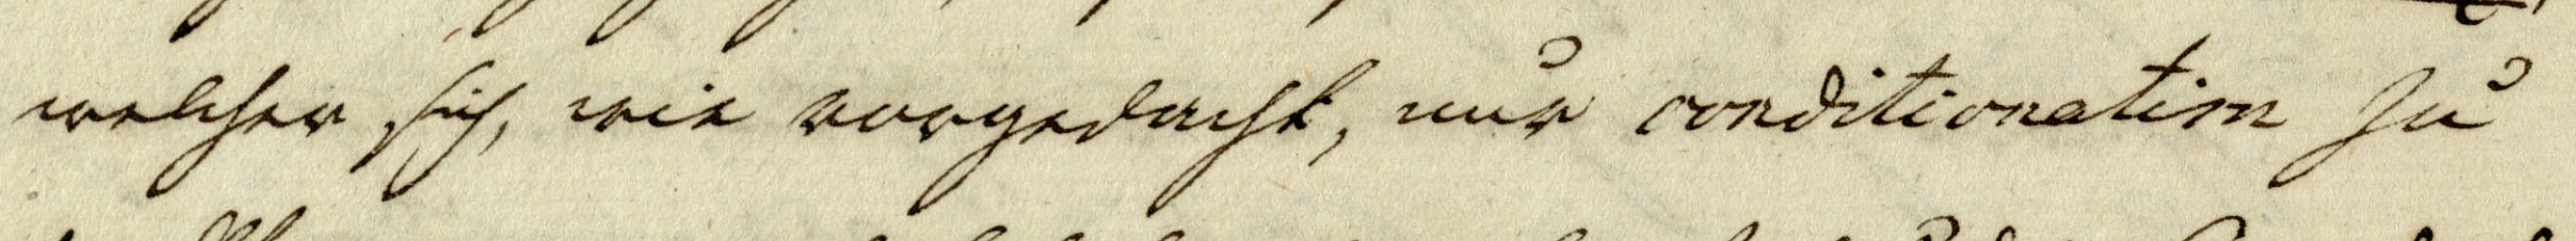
welcher sich, wie vorgedacht, nur conditionatim zu
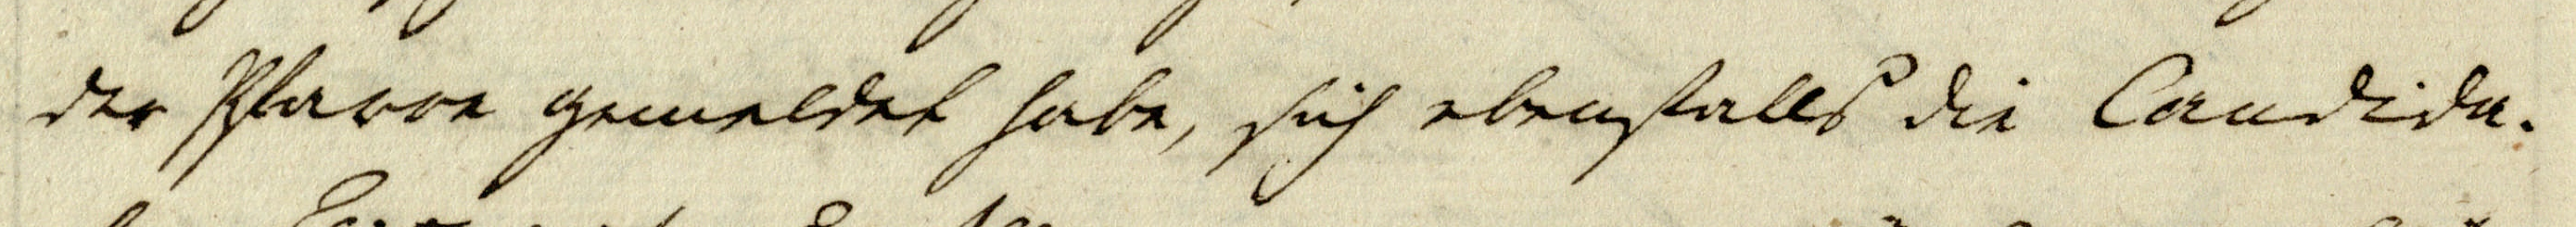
der Pfarre gemeldet habe, sich ebenfalls die Candida¬
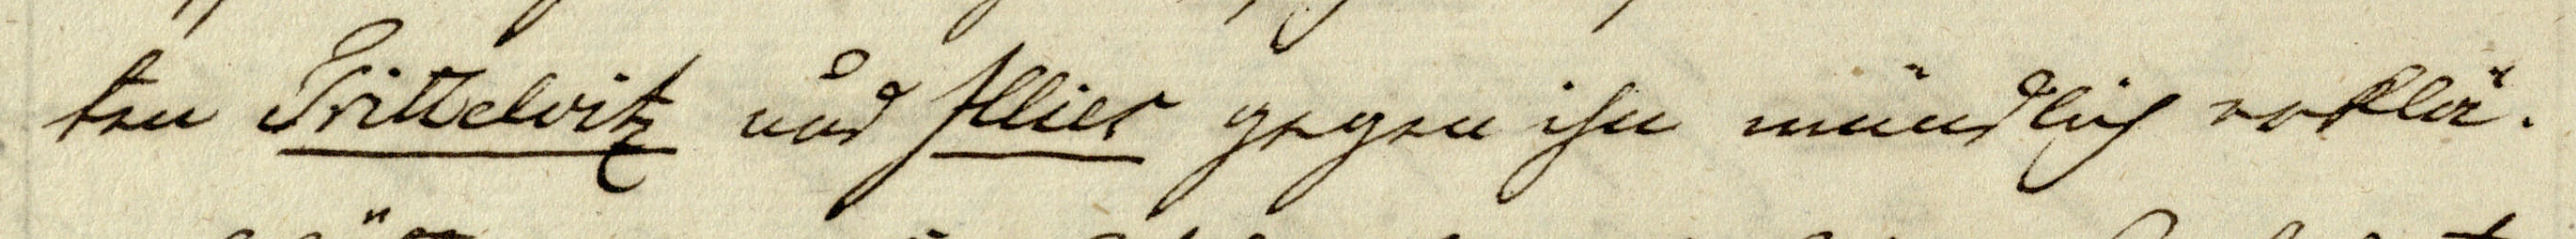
ten Trittelvitz und Illies gegen ihn mündlich erklä¬
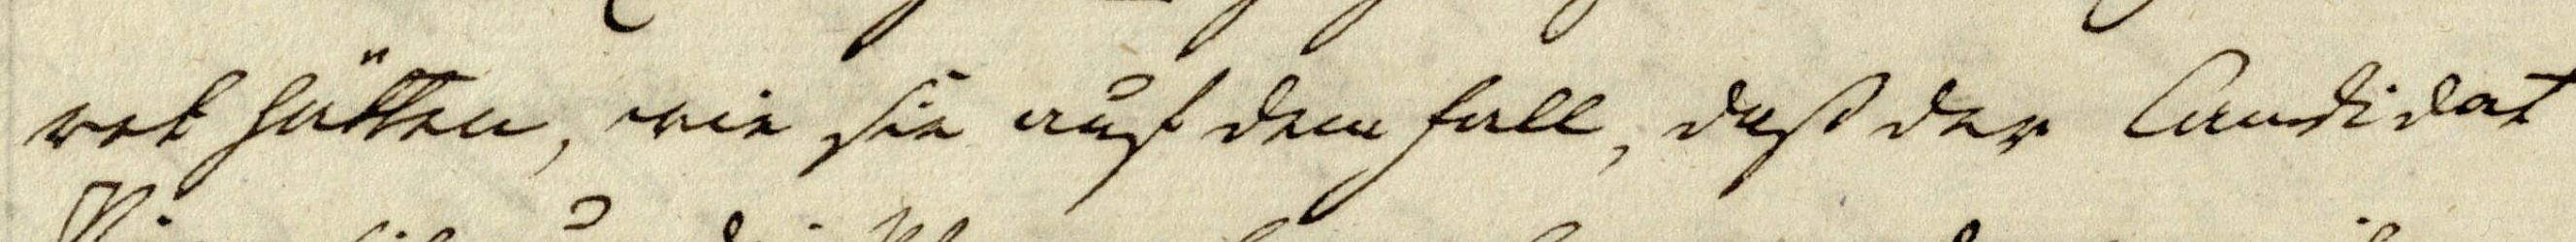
ret hätten, wie sie auf dem Fall, daß der Candidat
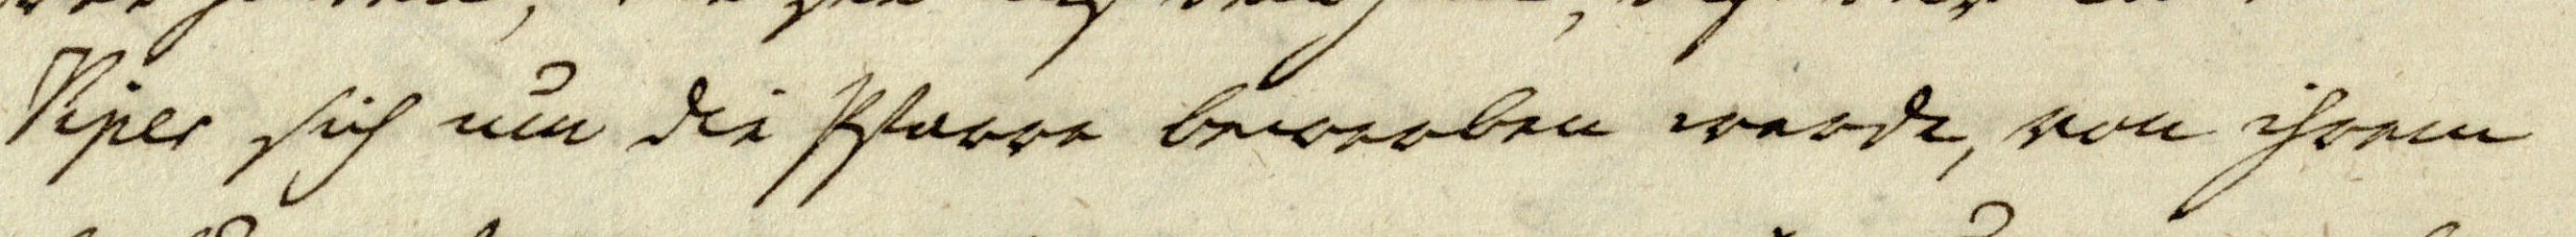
Piper sich um die Pfarre bewerben werde, von ihrem
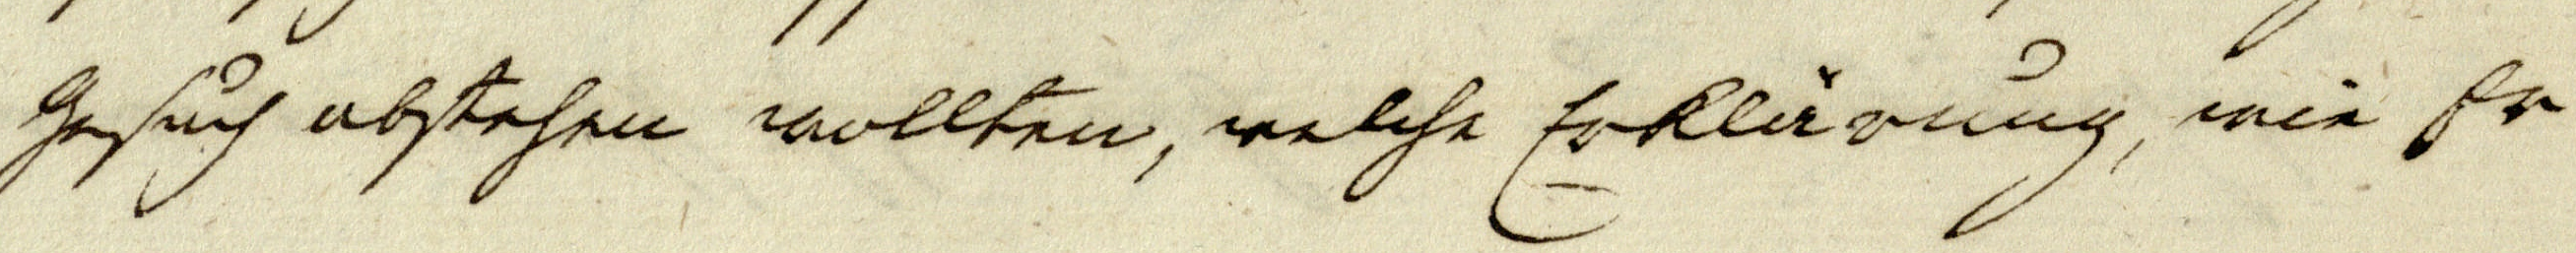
Gesuch abstehen wollten, welche Erklärung, wie Er
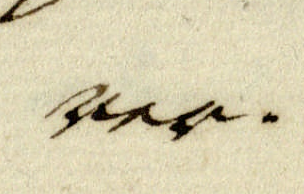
ver
